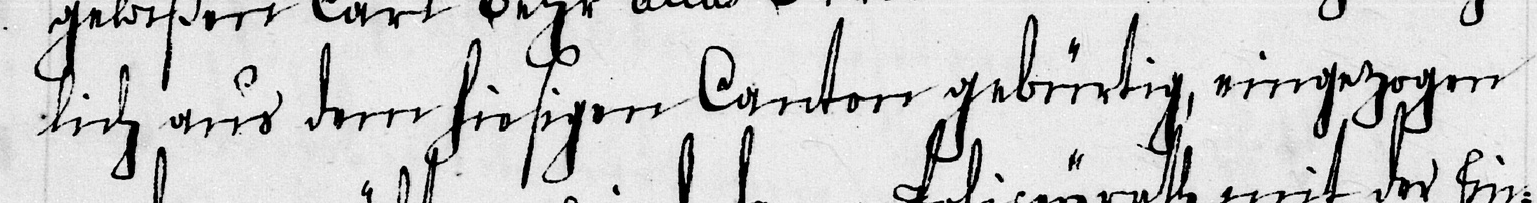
lich aus dem hiesigen Canton gebürtig, eingezogen
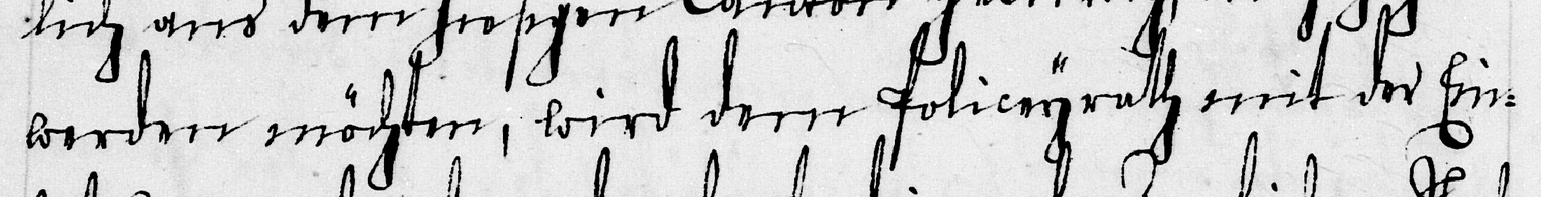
werden möchten, wird dem Policeyrath mit der Ein¬
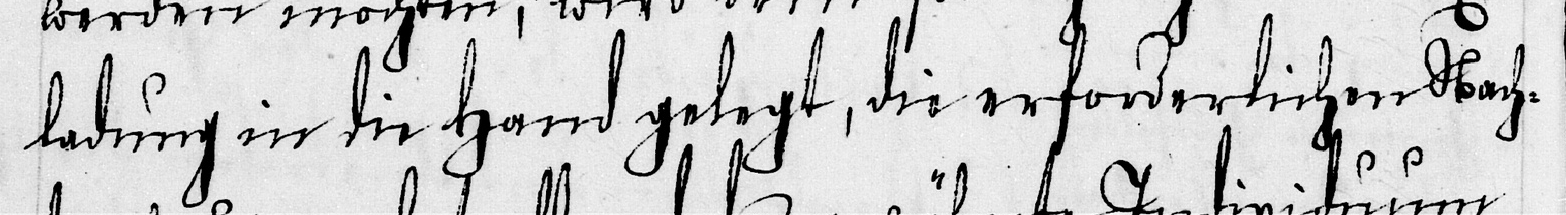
ladung in die Hand gelegt, die erforderlichen Nach¬
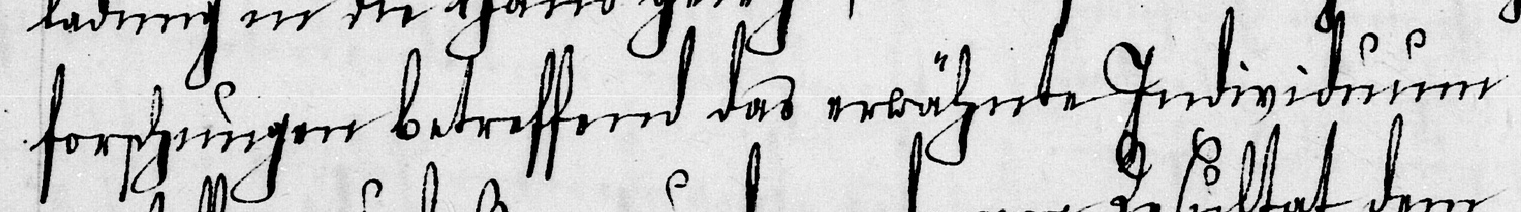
forschungen betreffend das erwähnte Individuum
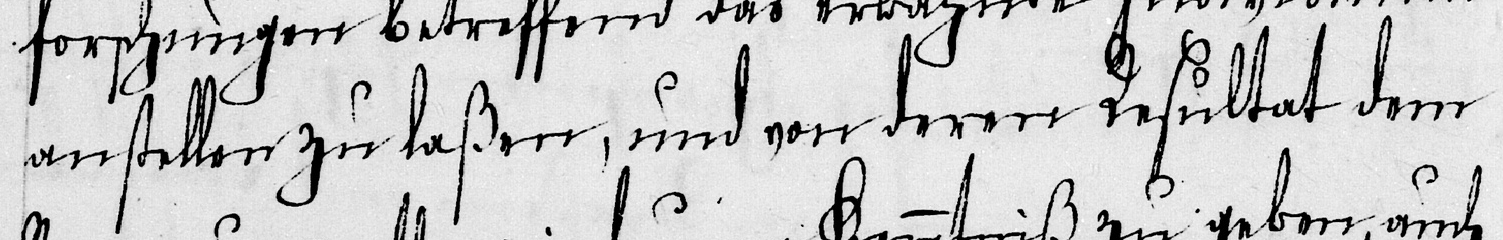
anstellen zu laßen, und von deren Resultat dem
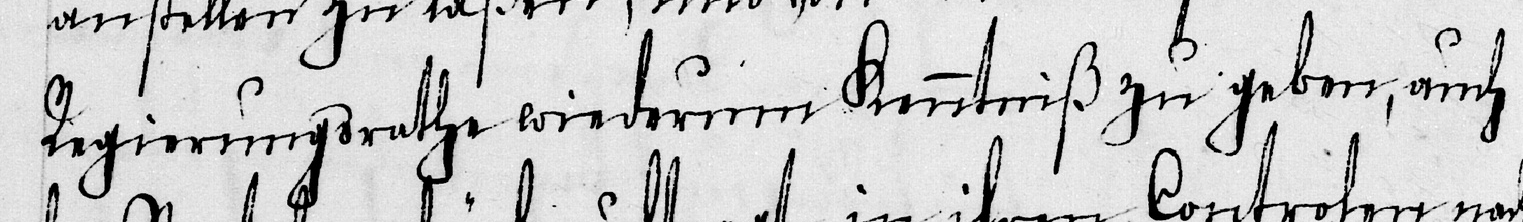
Regierungsrathe wiederum Kenntniß zu geben, auch
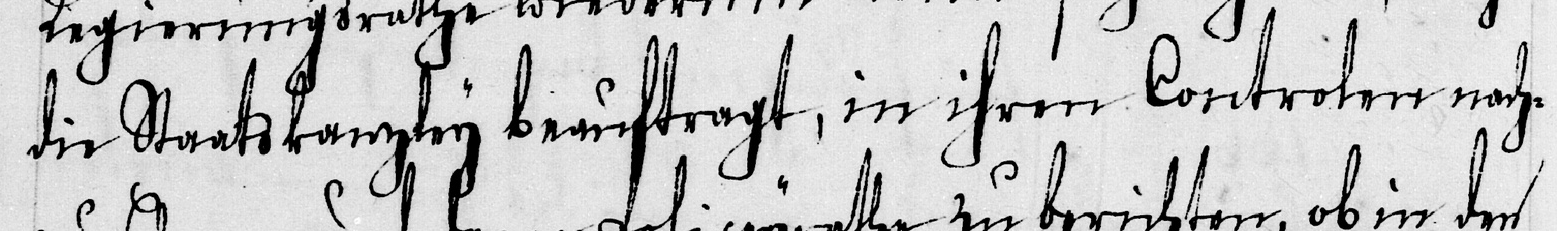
die Staatskanzley beauftragt, in ihren Controlen nach¬
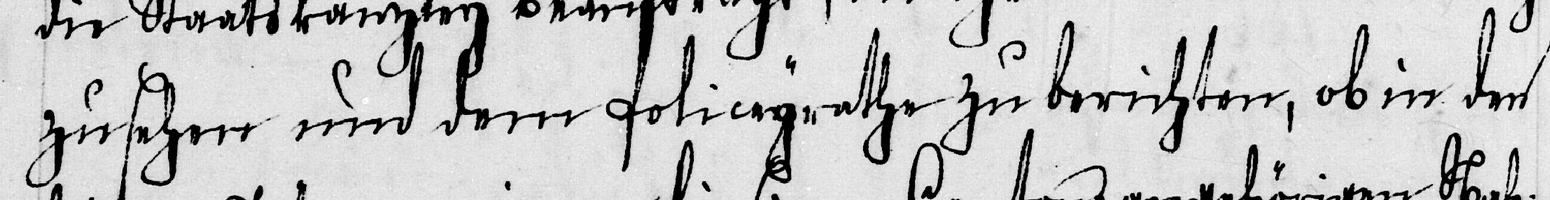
zusehen und dem Policeyrathe zu berichten, ob in den
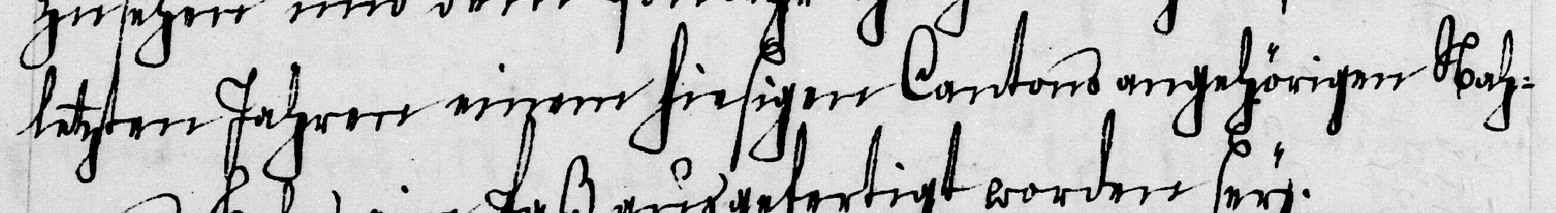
letzten Jahren einem hiesigen Cantonsangehörigen Nah¬
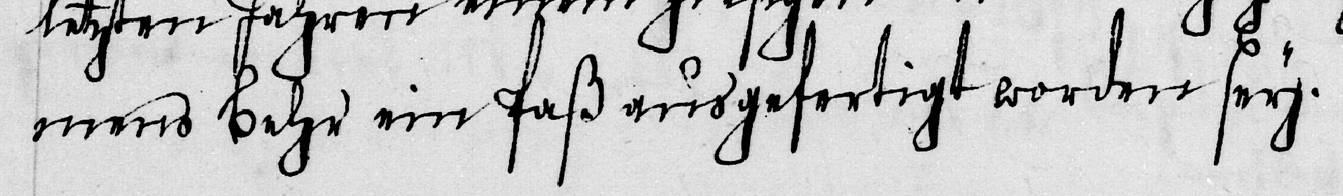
mens Behr ein Paß ausgefertigt worden sey.
